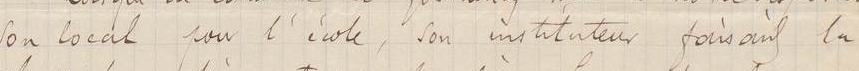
son local pour l'école, son instituteur faisait la
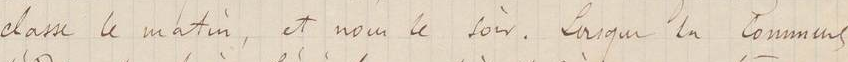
classe le matin, et nous le soir. Lorsque la Commune
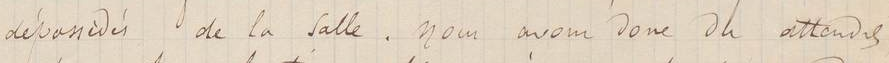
dépossédés de la salle. Nous avons donc du attendre,
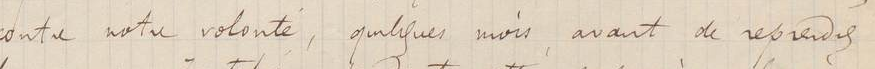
contre notre volonté, quelques mois, avant de reprendre
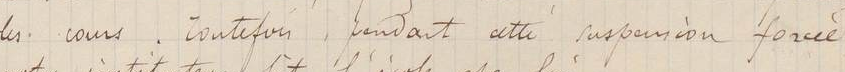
les cours. Toutefois, pendant cette suspension forcée,
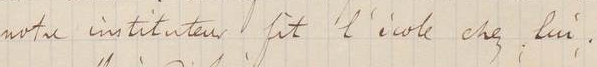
notre instituteur fît l'école chez lui.
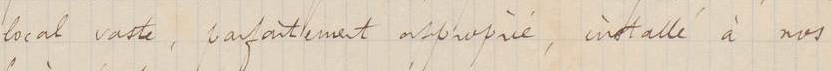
local vaste, parfaitement approprié, installé à nos
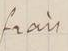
frais
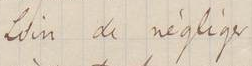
Loin de négliger
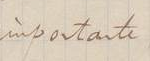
importante,
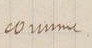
nous avons
